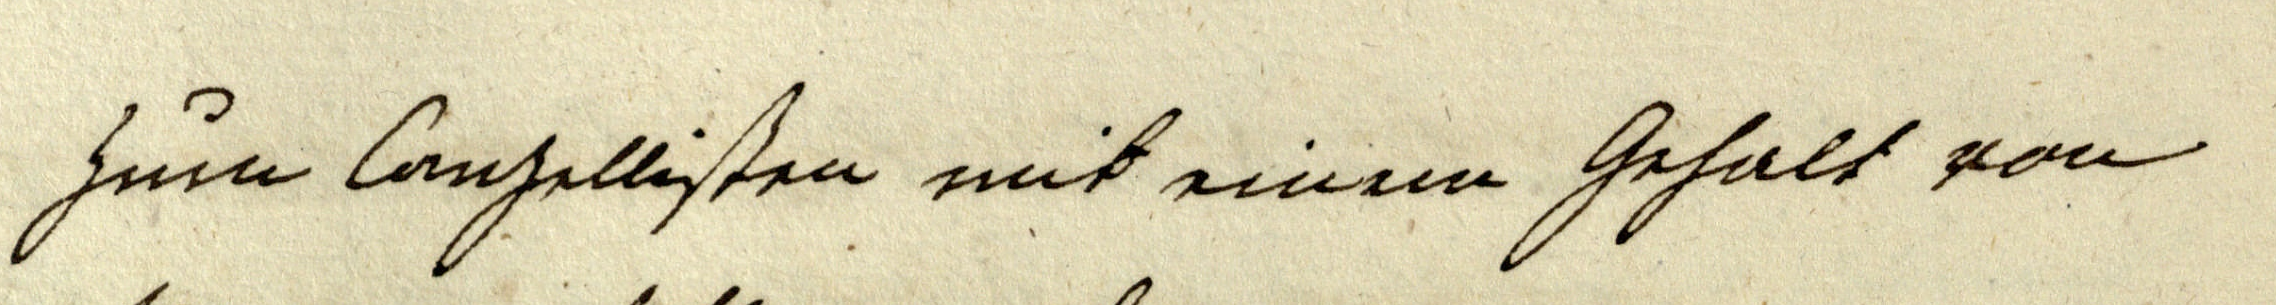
zum Canzellisten mit einem Gehalt von
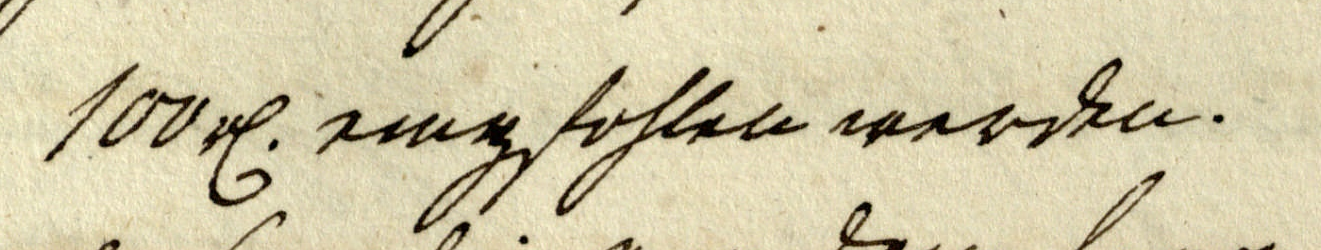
100 rl. empfohlen werden.
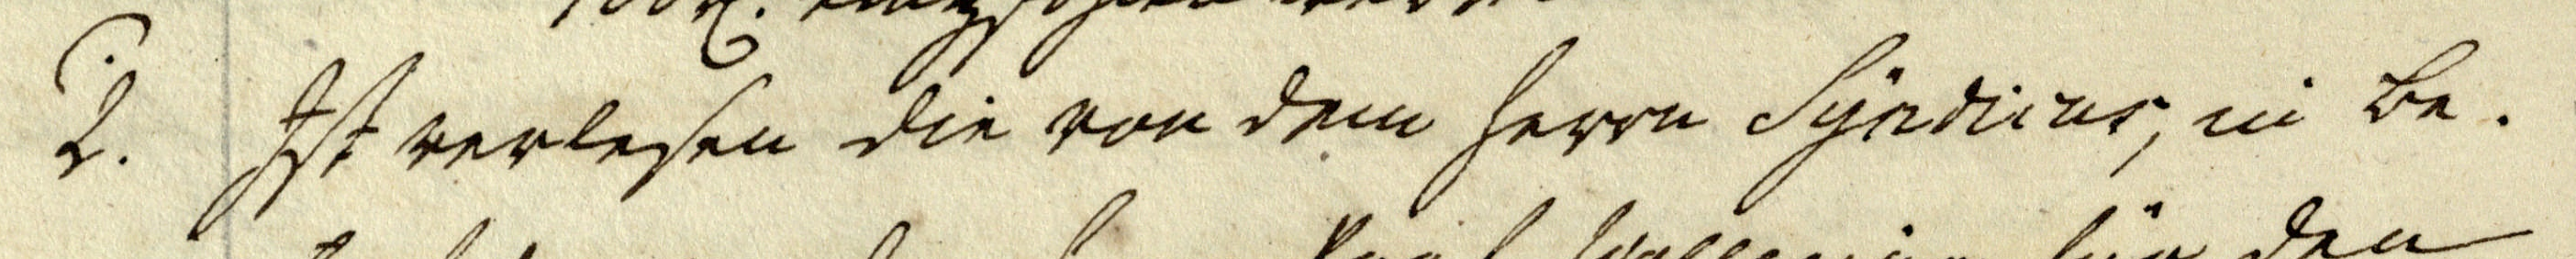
2. Ist verlesen die von dem Herrn Sÿndicus, in Be¬
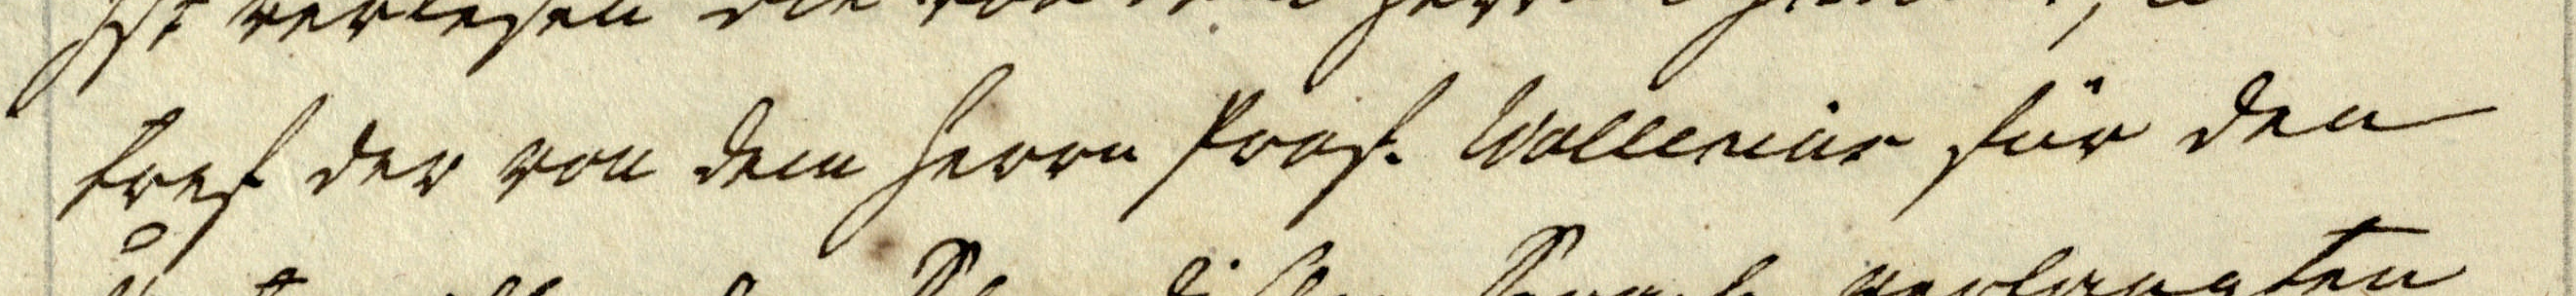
tref der von dem Herrn Prof. Wallenius für den
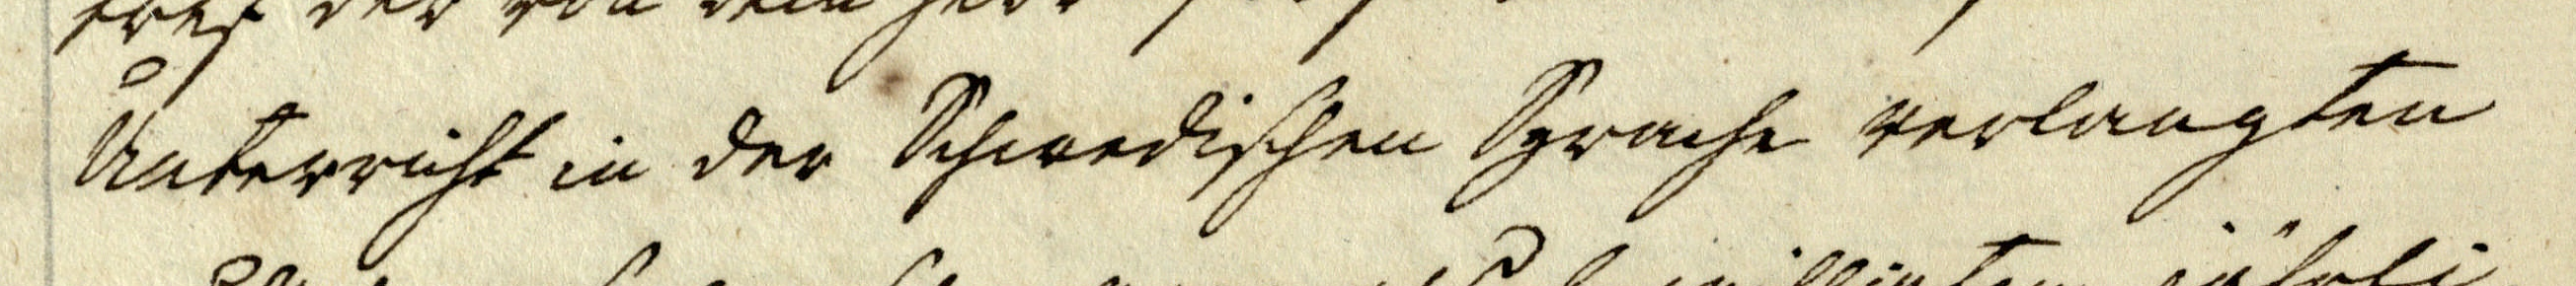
Unterricht in der Schwedischen Sprache verlangten
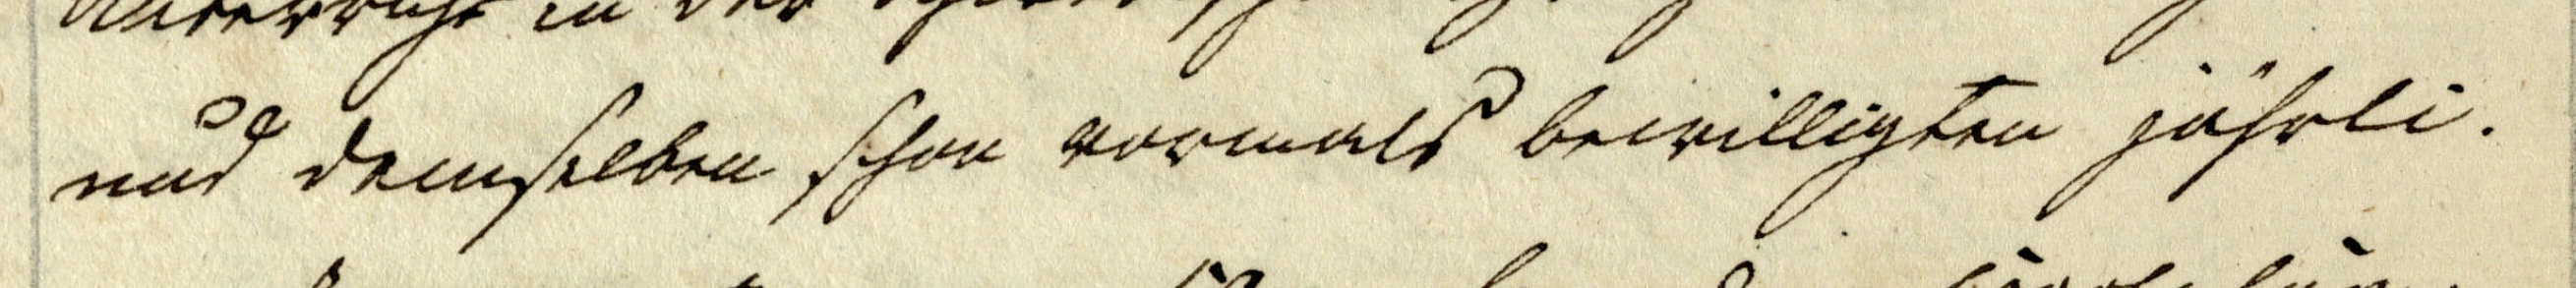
und demselben schon vormals bewilligten jährli¬
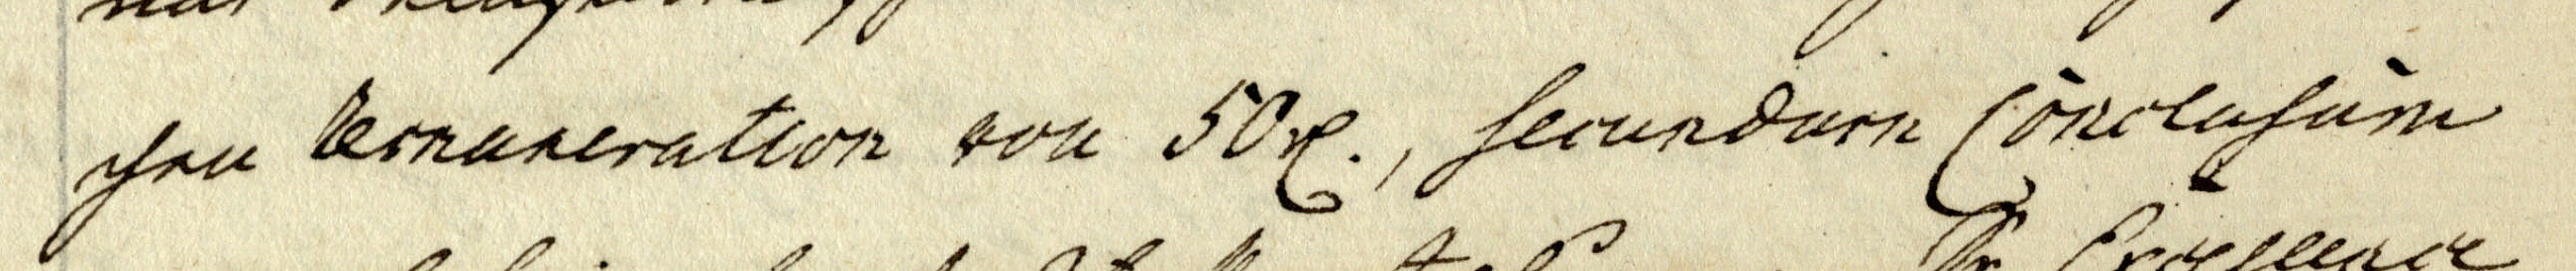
chen Remuneration von 5 rl. secundum Conclusum
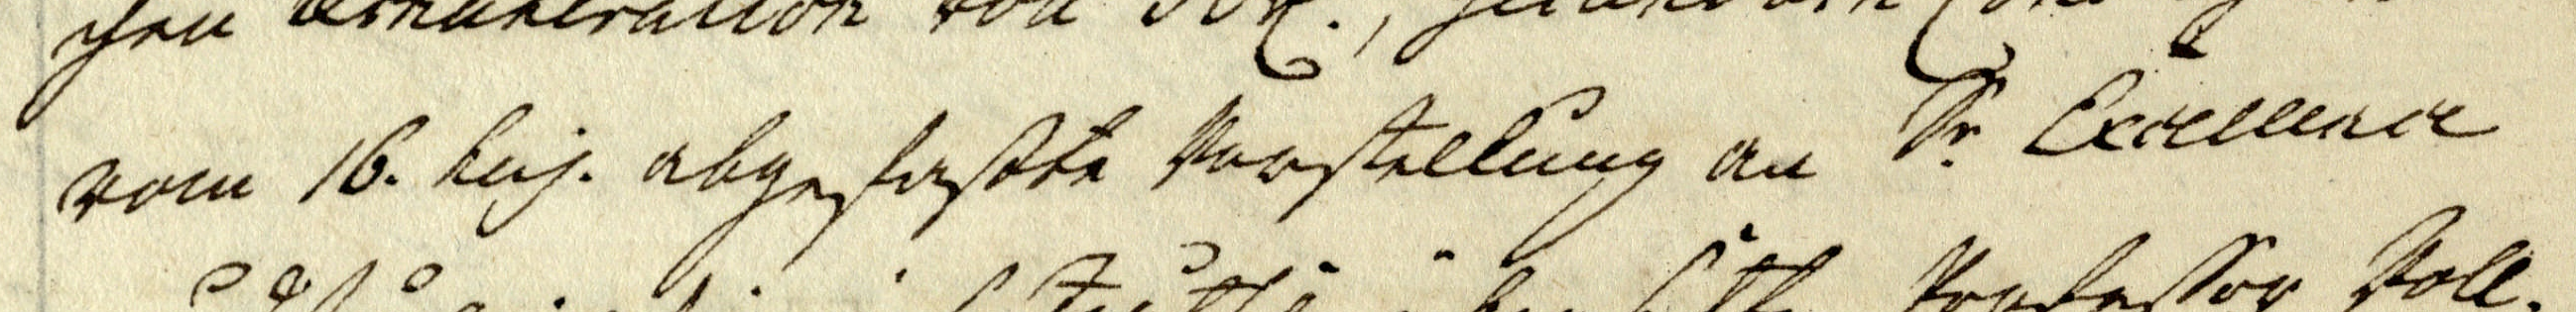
vom 16. huj. abgefaßte Vorstellung an Sr. Excellence
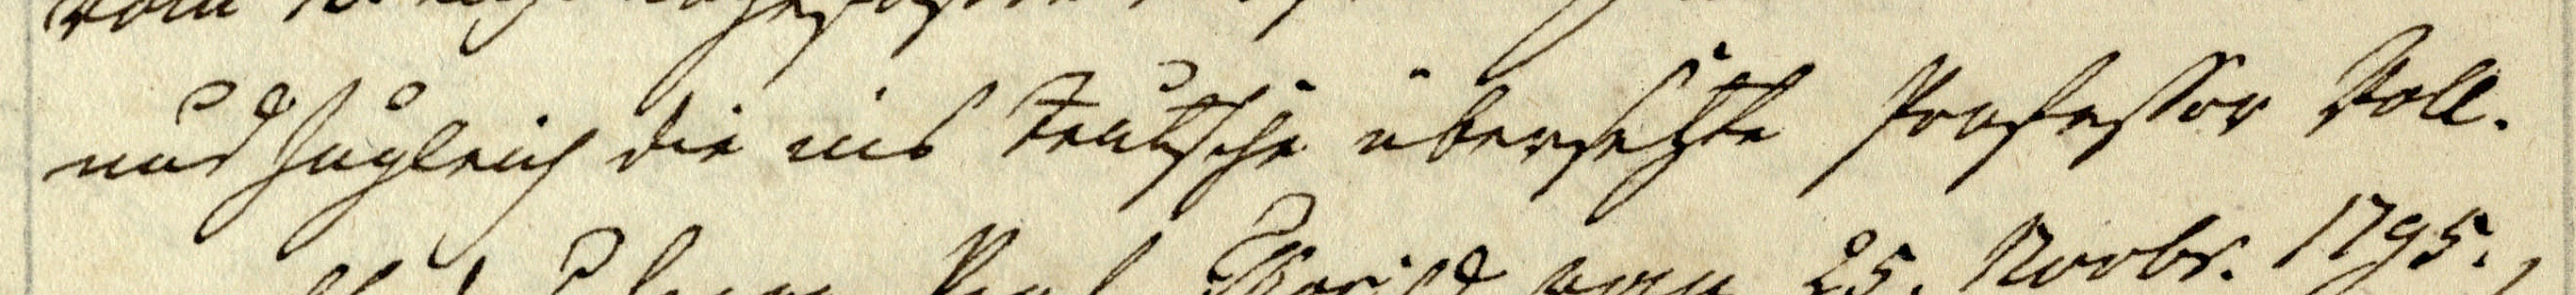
und zugleich die ins Teutsche übersetzte Professor Voll¬
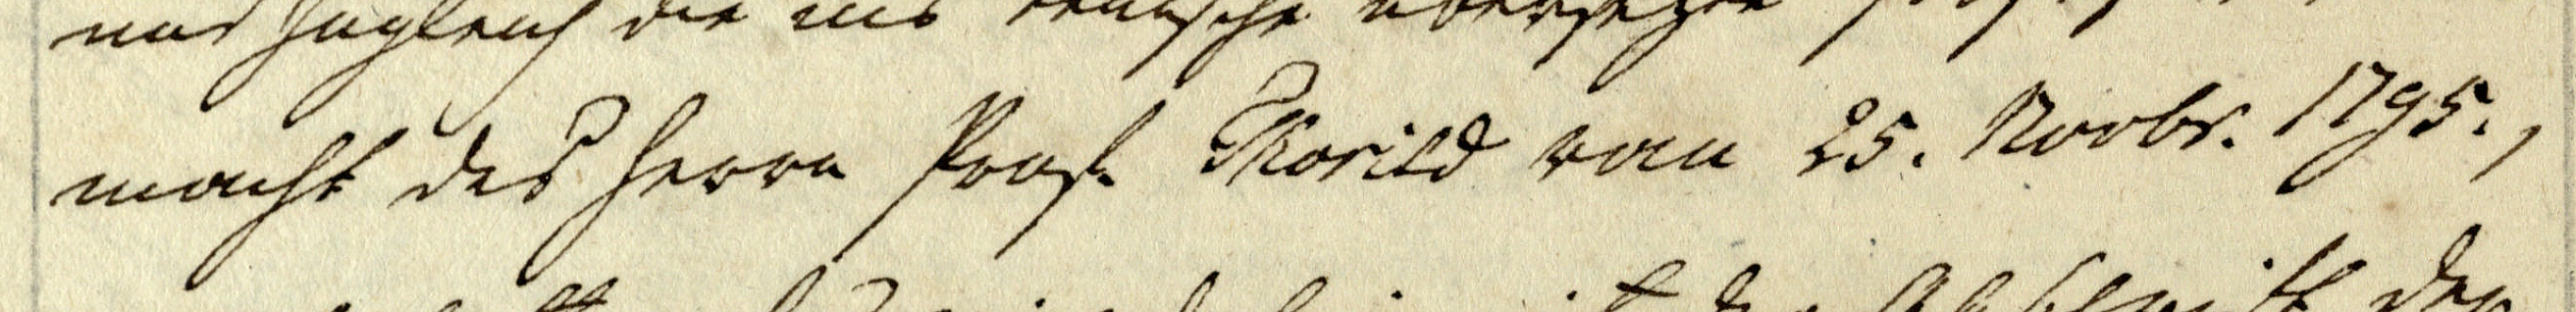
macht des Herrn Prof. Thorild vom 25. Novbr. 1795.,
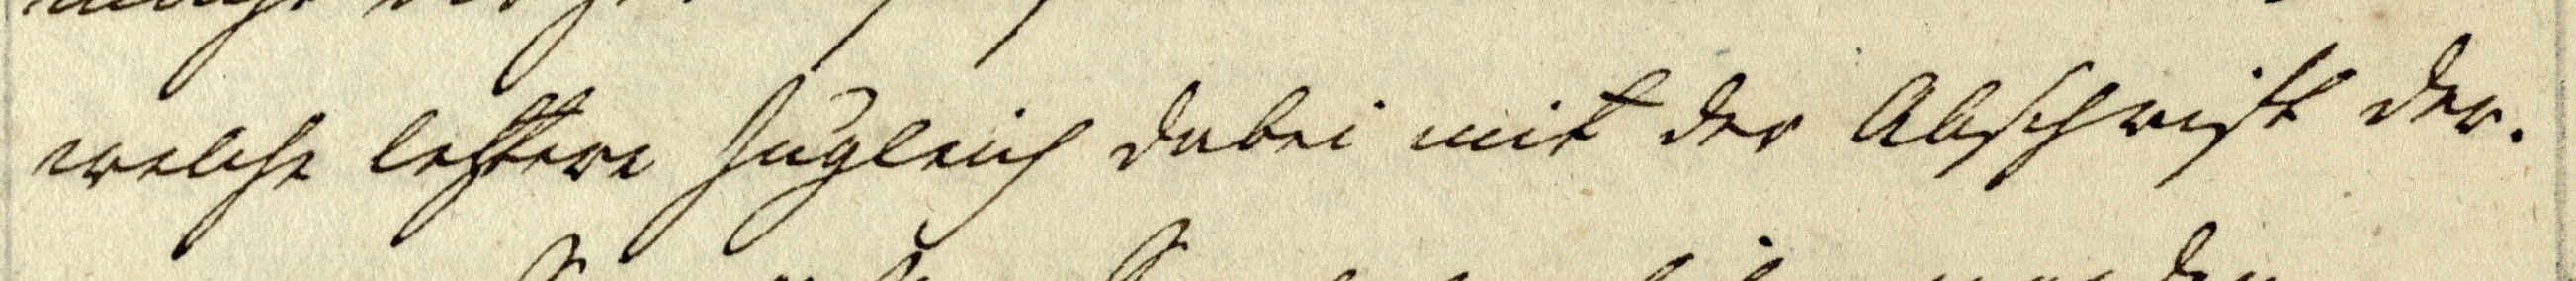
welche letztere zugleich dabei mit der Abschrift der¬
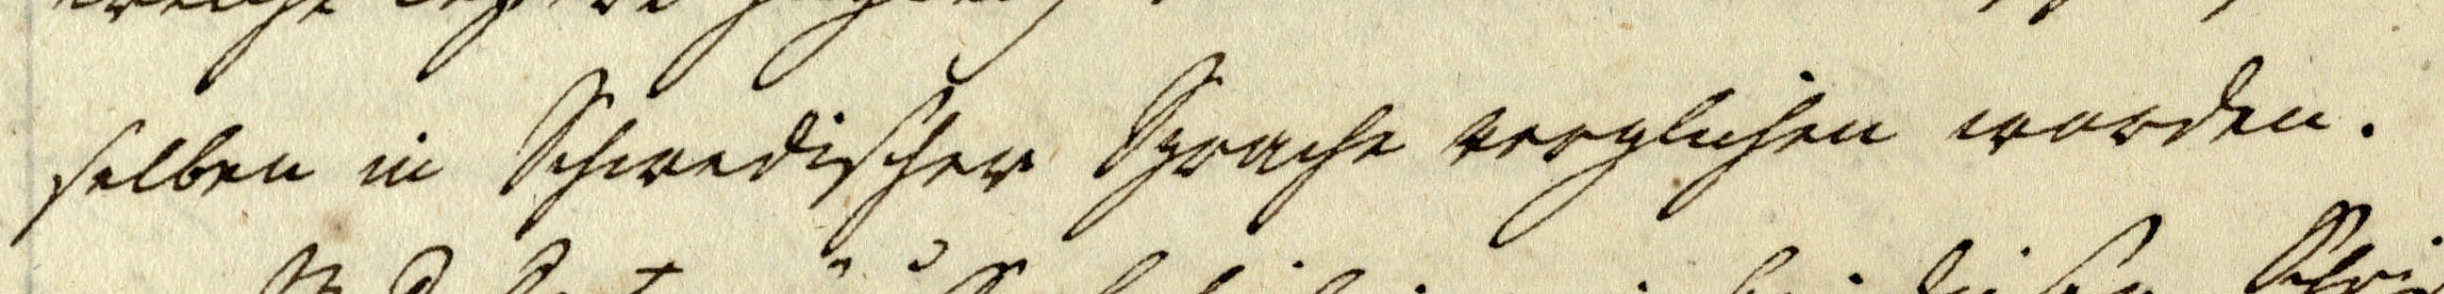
selben in Schwedischer Sprache verglichen worden.
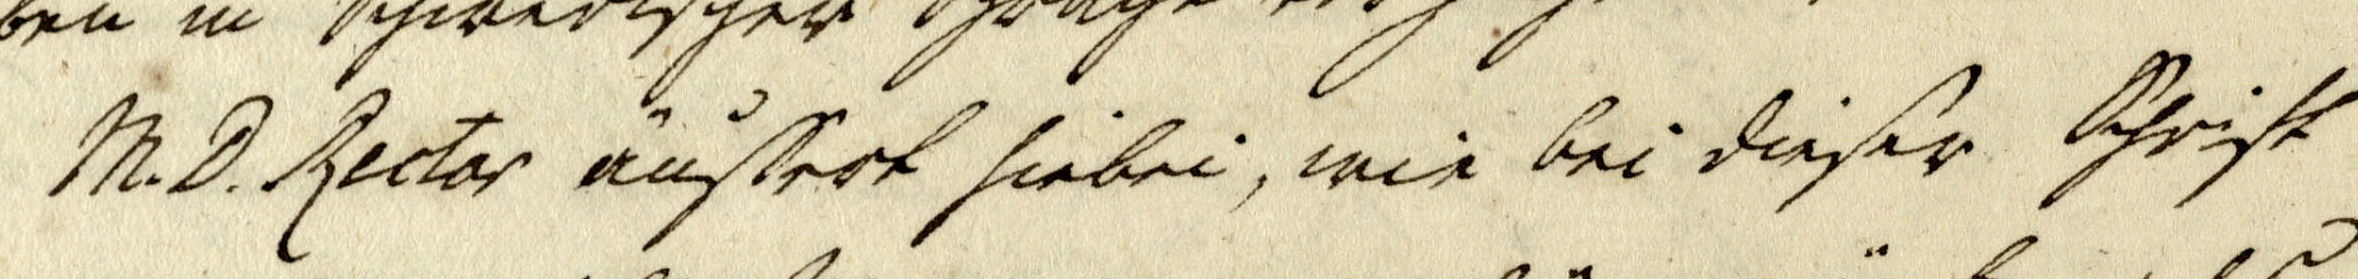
M. D. Rector äussert hiebei, wie bei dieser Schrift
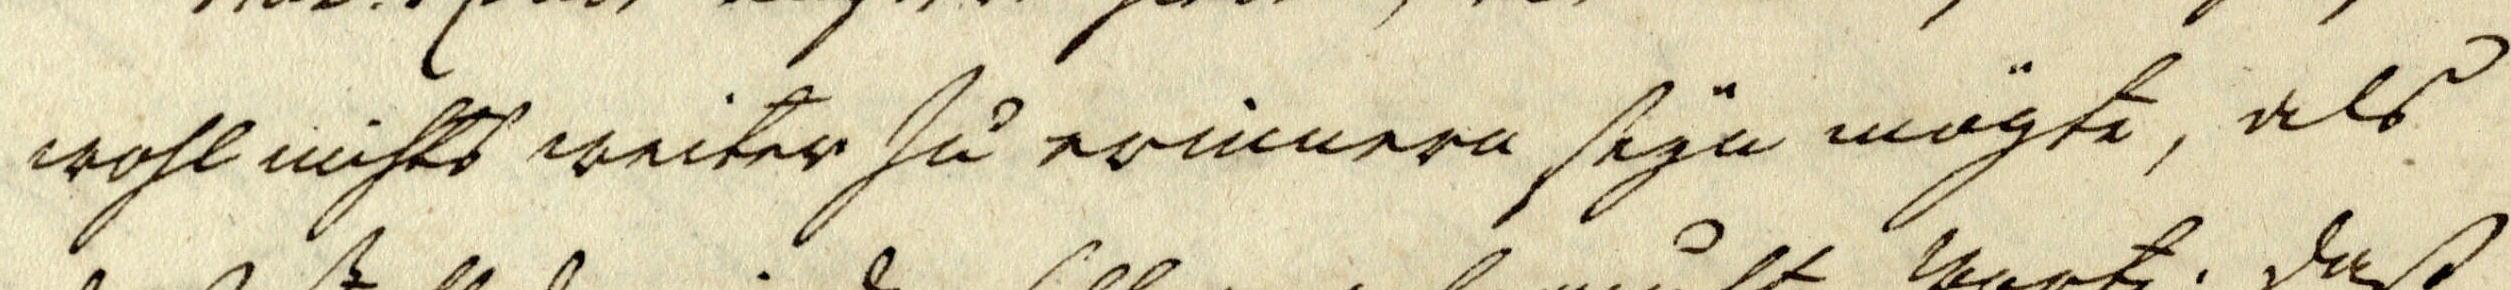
wohl nichts weiter zu erinnern seÿn mögte, als
